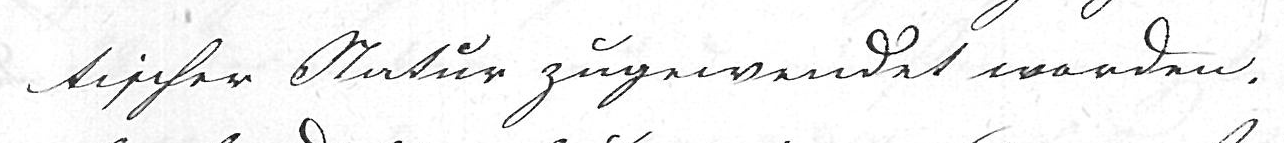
tischer Natur zugewendet worden.
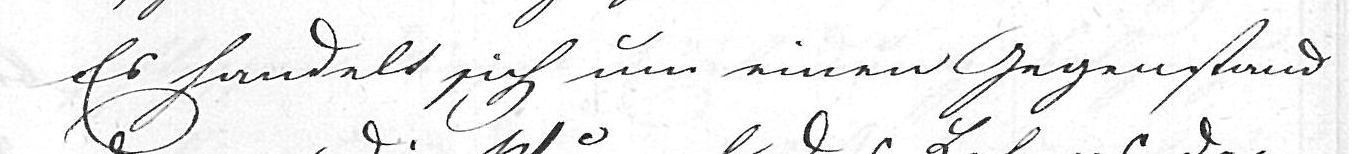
Es handelt sich um einen Gegenstand
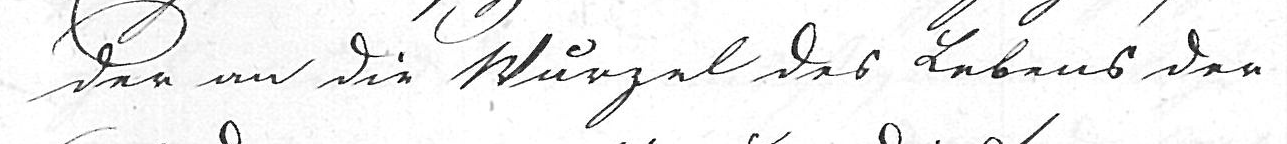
der an die Wurzel des Lebens der
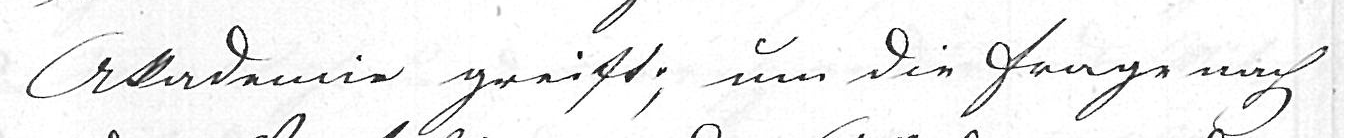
Akademie greift, um die Frage nach
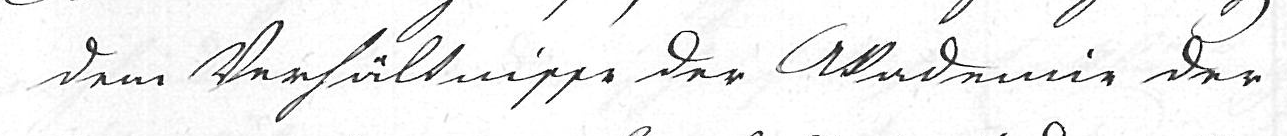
dem Verhältnisse der Akademie der
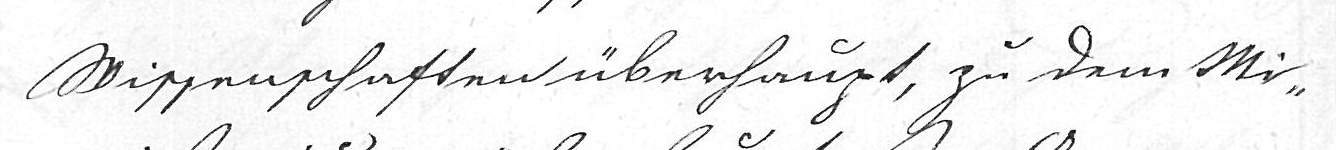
Wissenschaften überhaupt, zu dem Mi-
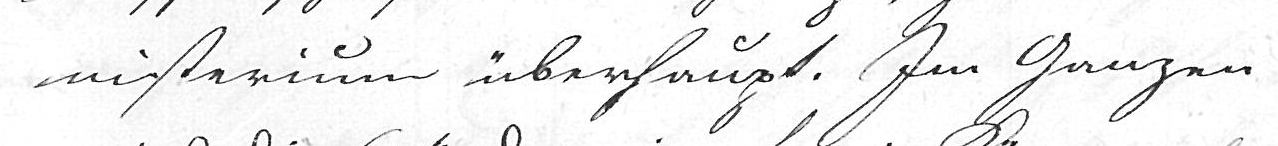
nisterium überhaupt. Im Ganzen
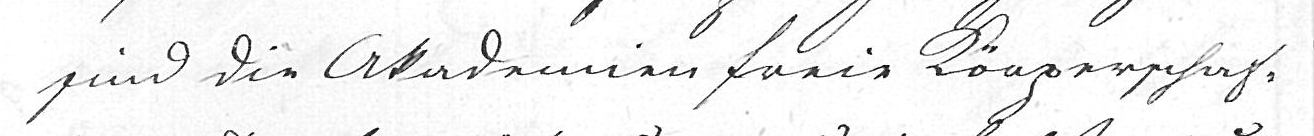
und die Akademien freie Körperschaf-
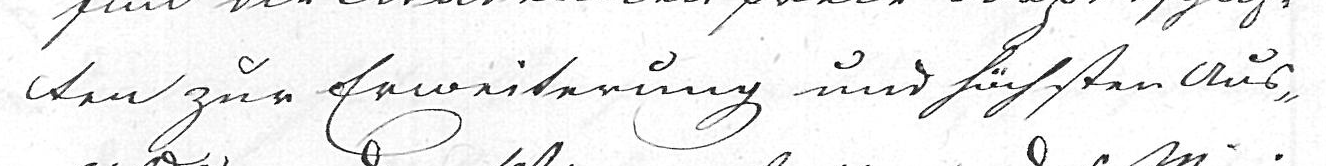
ten zur Erweiterung und höchsten Aus-
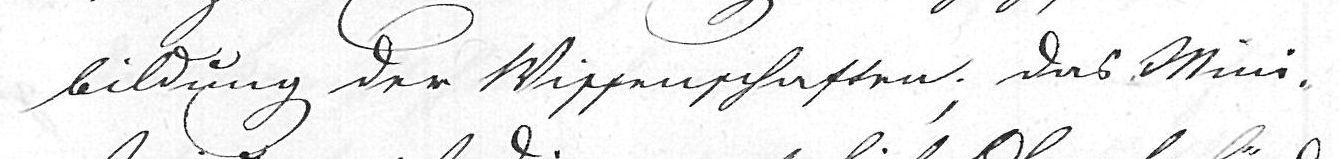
bildung der Wissenschaften; das Mini-
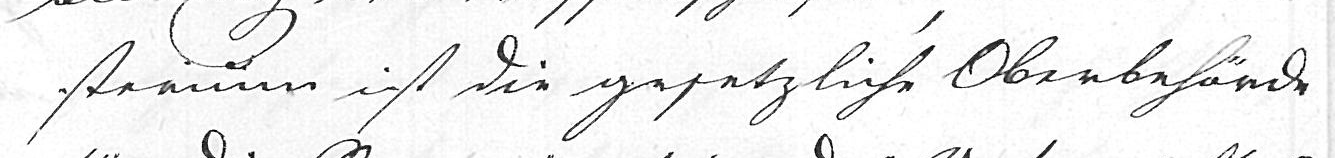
sterium ist die gesetzliche Oberbehörde
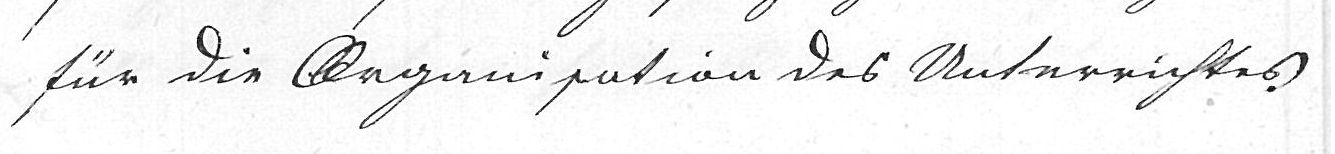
für die Organisation des Unterrichtes.
